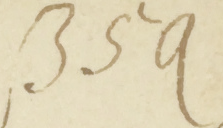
359
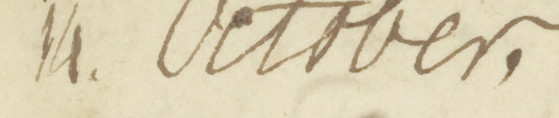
14. October.
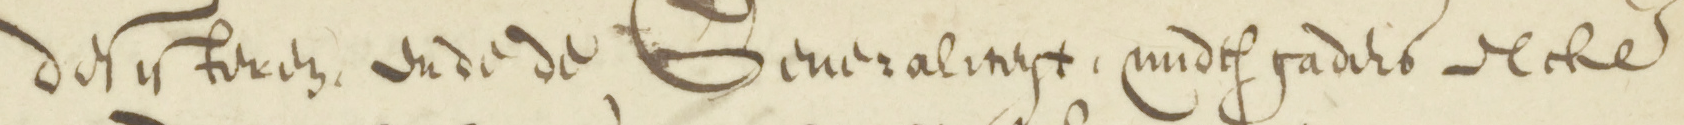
desisteren, ende de Generaliteyt, midtsgaders elcke
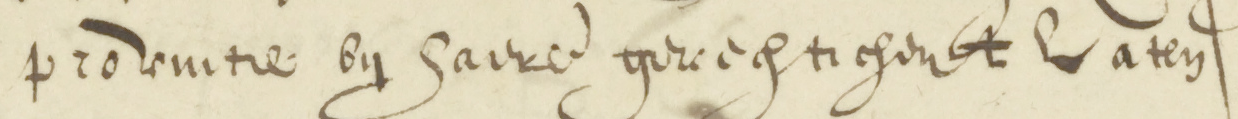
provintie by haere gerechticheyt laten.
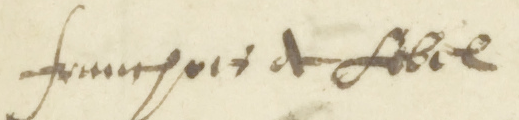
franchois de Lobel
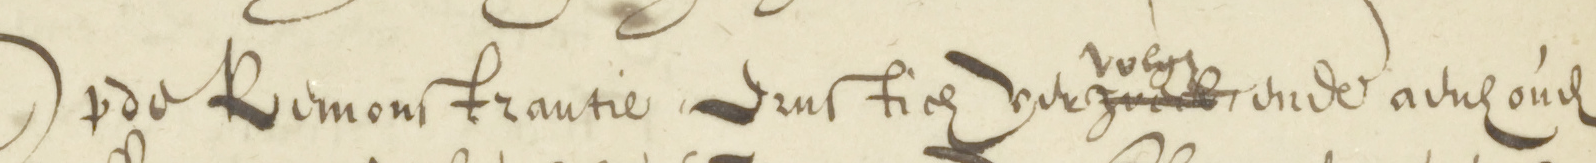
Opde Remonstrantie, ernstich verzueckvolgh ende aenhoud
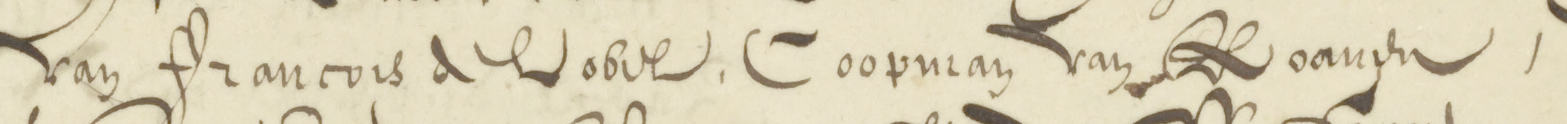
van Francois de Lobel, Coopman van Roanen,
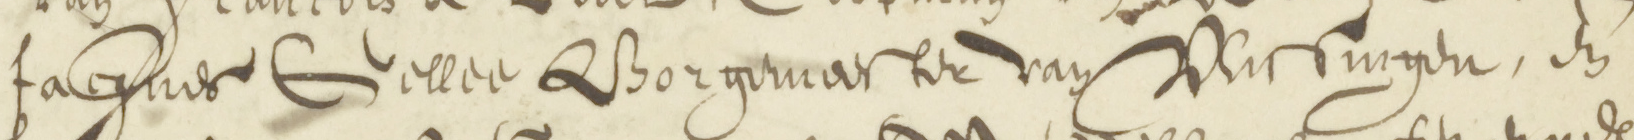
Jacques Gellee Borgemeester van Vlissingen, en
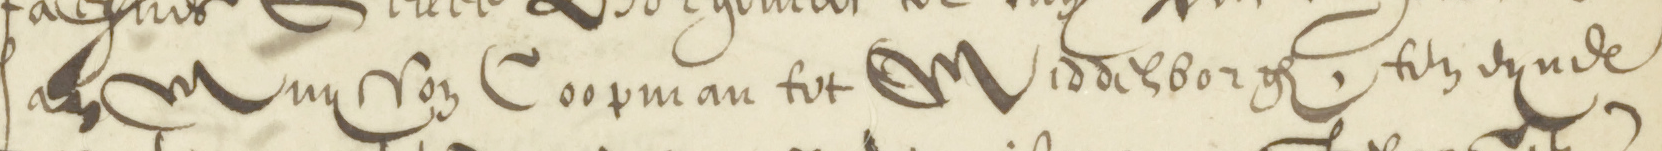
Jan Muysson Coopman tot Middelborgh, ten eynde
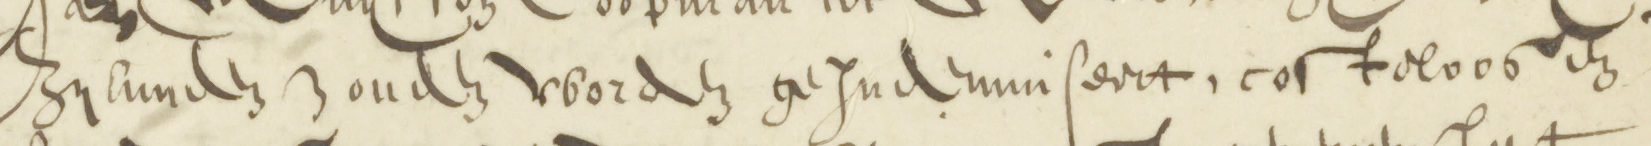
zyluyden zouden worden geIndemniseert, costeloos en
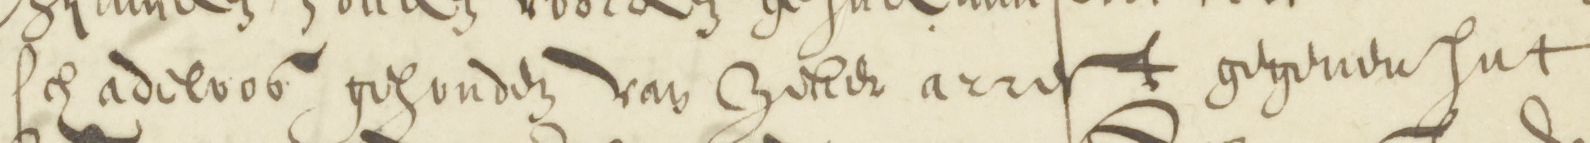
schadeloos gehouden van zeker arrest gegeuen Int
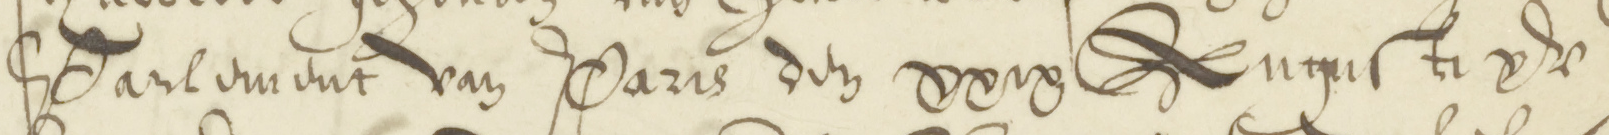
Parlement van Paris den xxix Augusti xvC
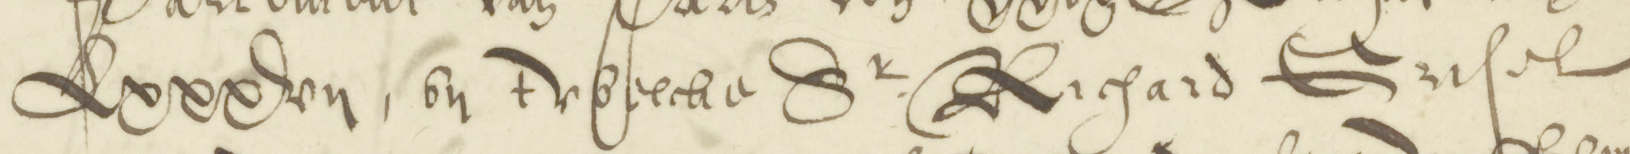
Lxxxvij, by twelcke Sr Richard Grisel
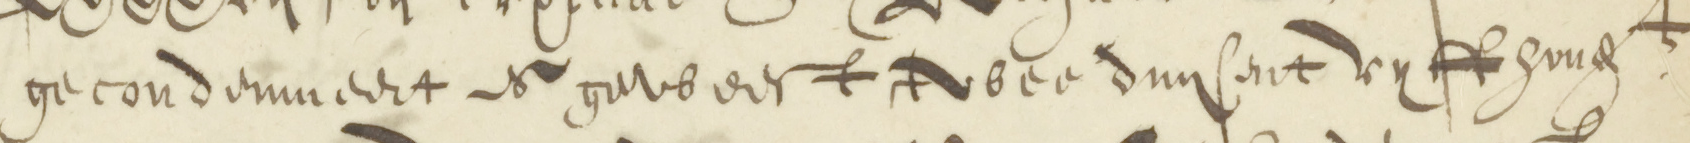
gecondemneert es geweest twee duysent vyffhondt
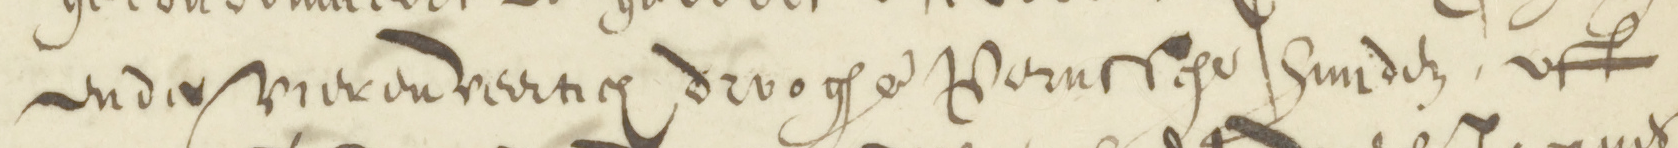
ende vierenveertich drooghe Perussche huyden, off
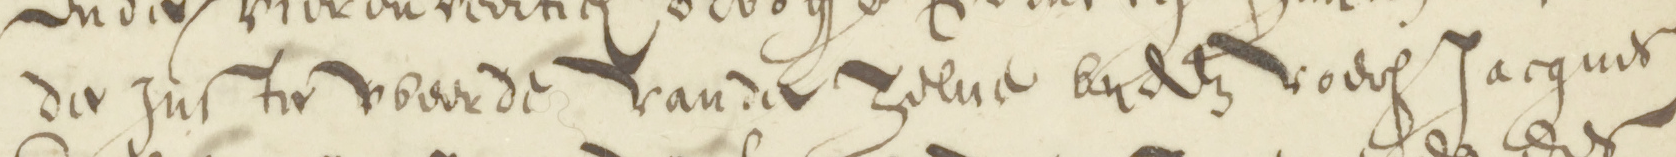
de juste weerde vande zelue byden voers Jacques
